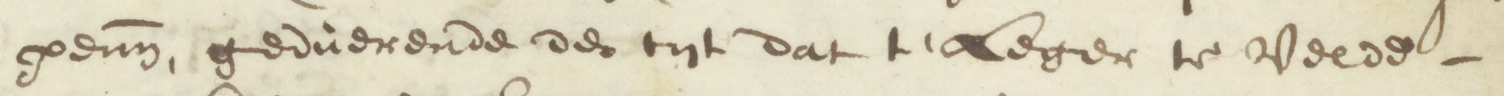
penn, geduerende den tijt dat t' Leger te Velde -
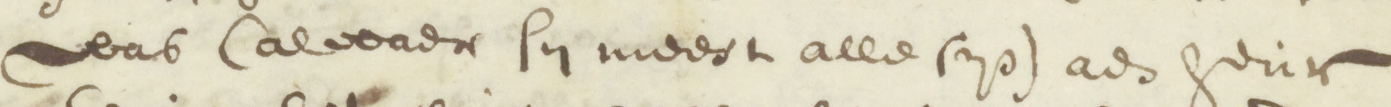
was (alwaer sij meest alle sijn) aen heur
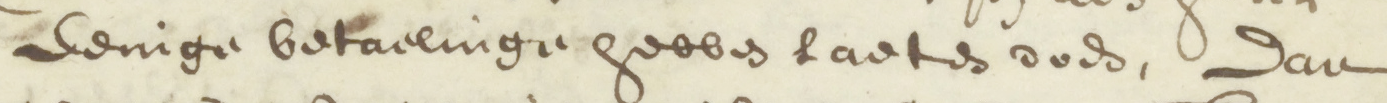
Eenige betaelinge hebben laeten doen. Dan
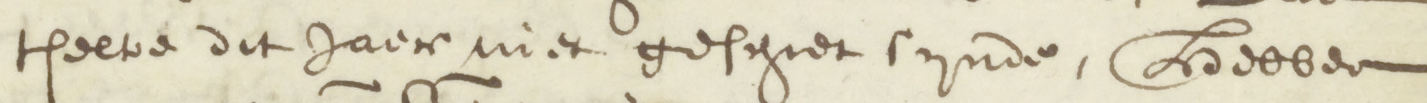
tselve dit Jaer niet geschiet sijnde, Hebben
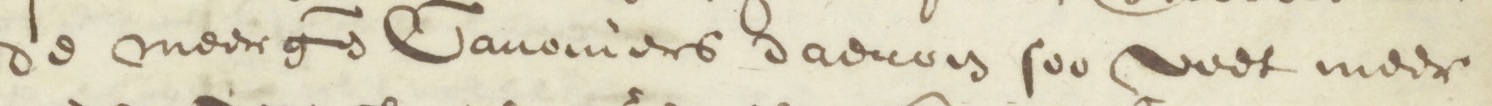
de meer gem Canoniers daerom soo veel meer
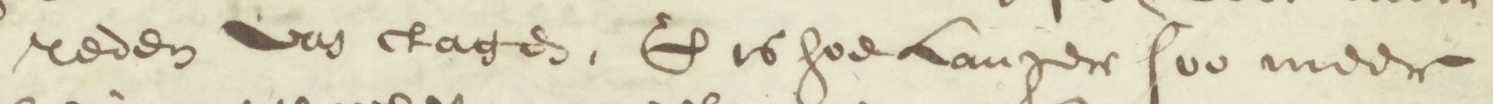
reden van clagen, & is hoe Langer soo meer
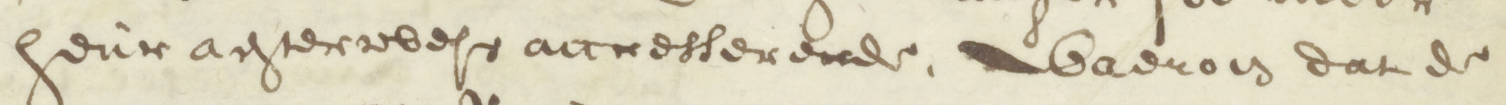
heur achterwesen accresserende. Waerom dat de
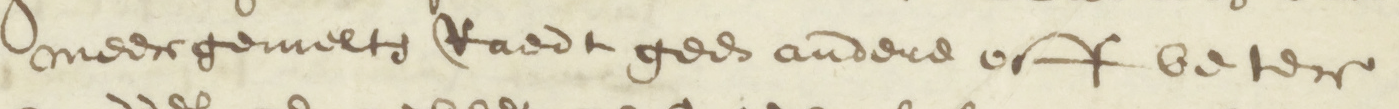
meer gemelten Raedt geen andere off beter
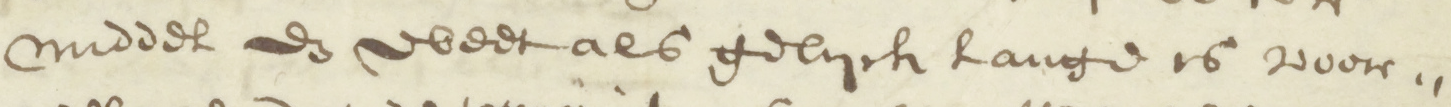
middel en weet als gelijck lange is voor„
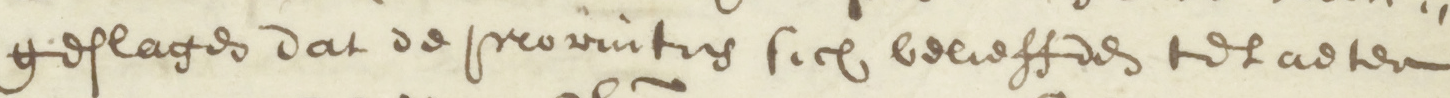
geslagen dat de provintien sich belieffden te laeten
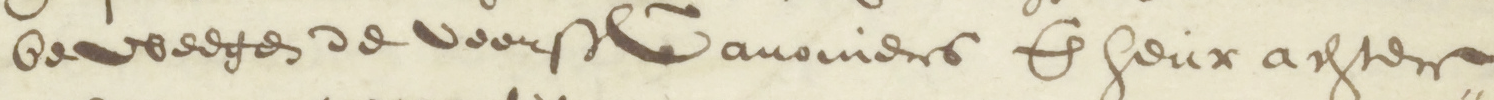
beweegen de voorsz Canoniers & heur achter„
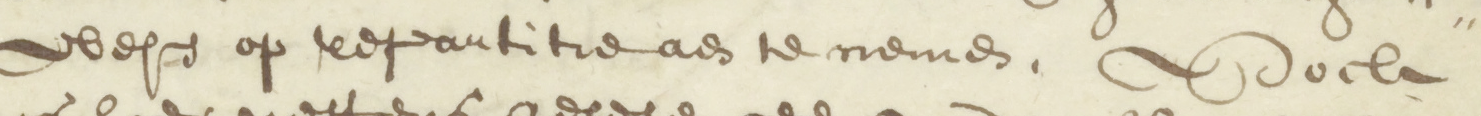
wesen op repartitie aen te nemen. Oock
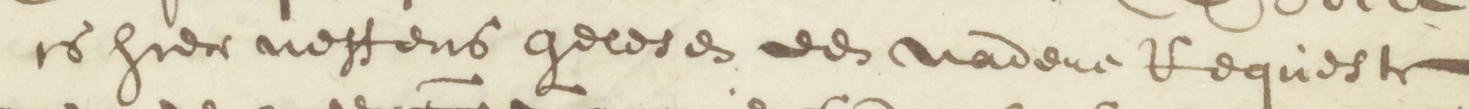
is hier neffens gelesen een nadere Requeste
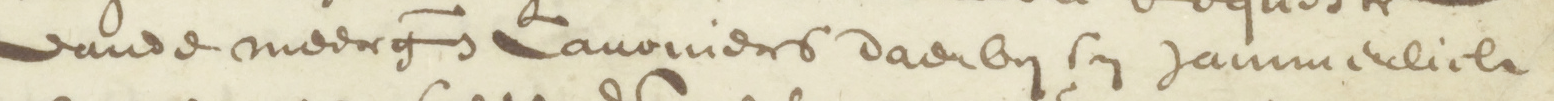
vande meer gem Canoniers daerbij sij jammerlick
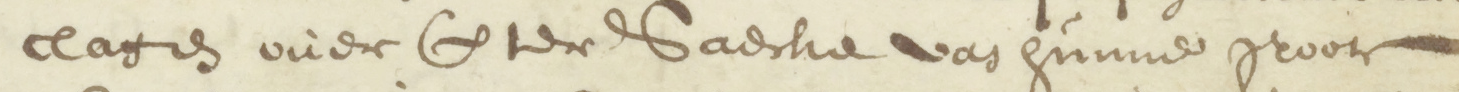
clagen ouer & ter Saecke van hunne groote
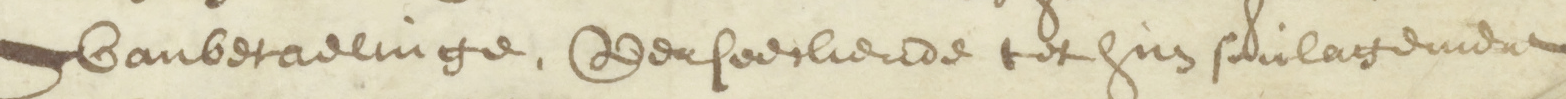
Wanbetaelinge. Versoeckende tot hun soulagement
